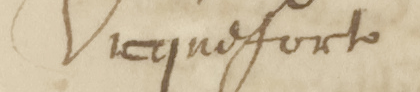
Vicquefort
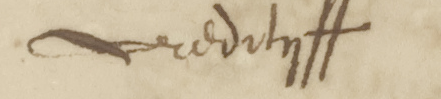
credityff
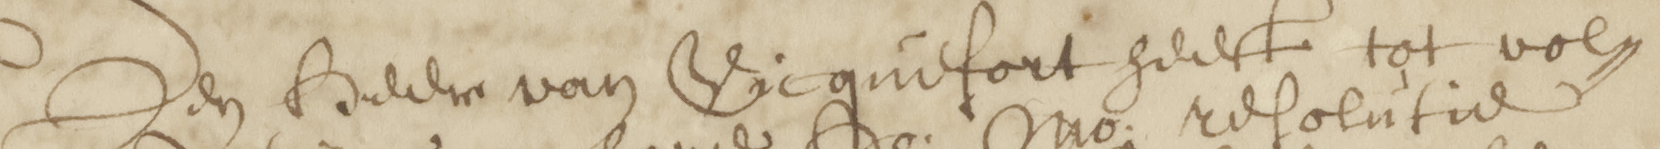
Den Heer van Vicquefort heeft tot vol„
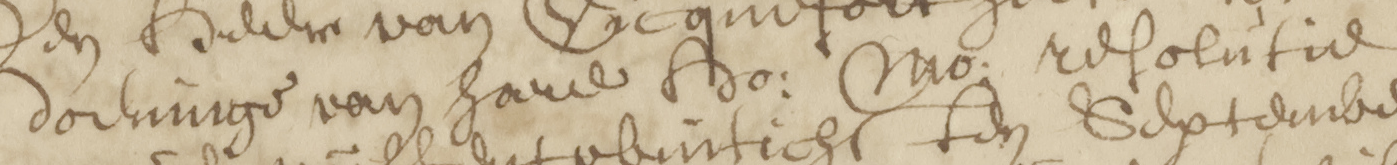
doeninge van hare Ho:Mo: resolutie
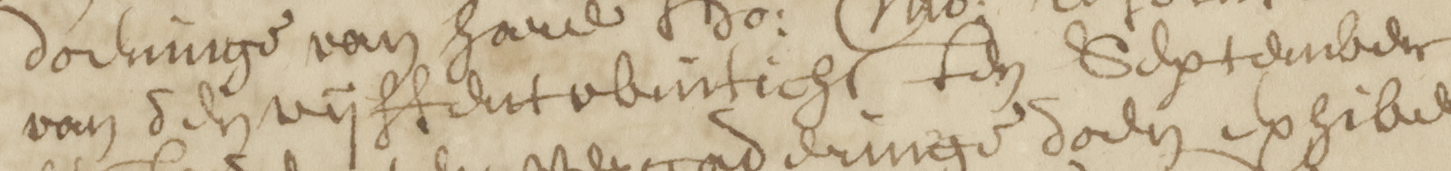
van den vijffentwintichsten September
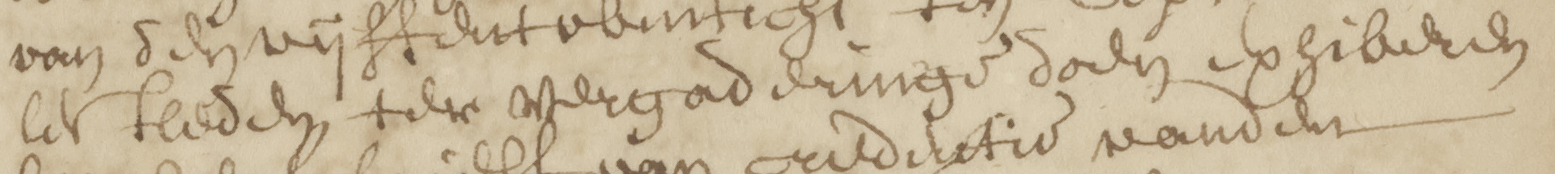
lestleden, ter vergaderinge doen exhiberen
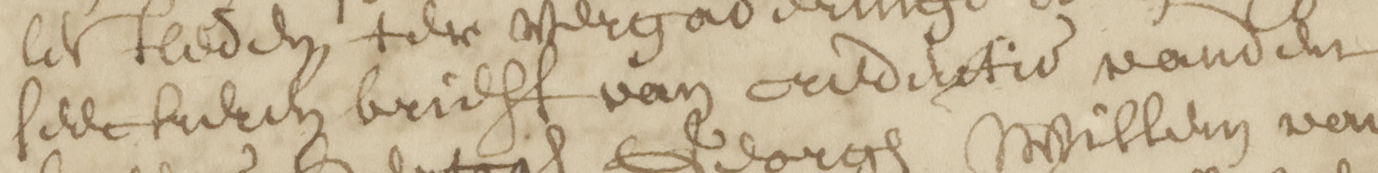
seeckeren brieff van credentie vanden
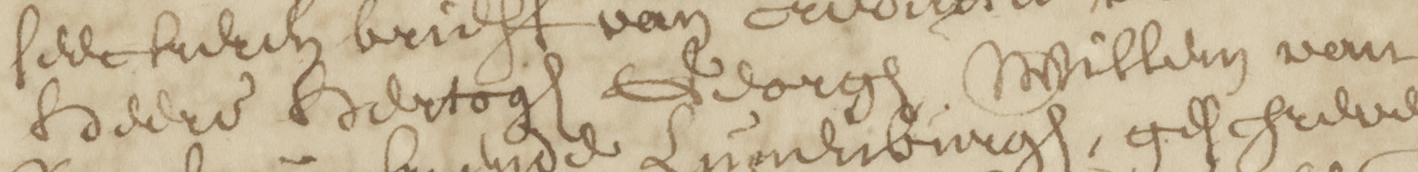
Heere Hertogh Georgh Willem van
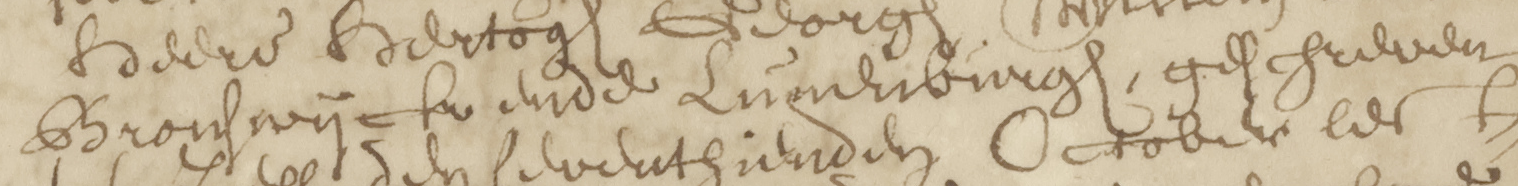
Bronswijck ende Lunenburgh, geschreven
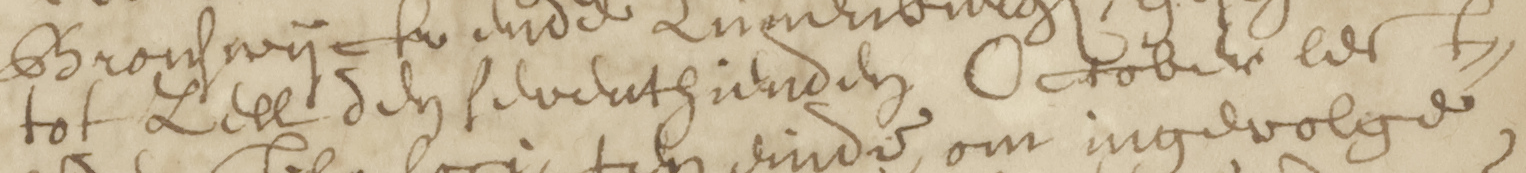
tot Zell den seventhienden October lest„
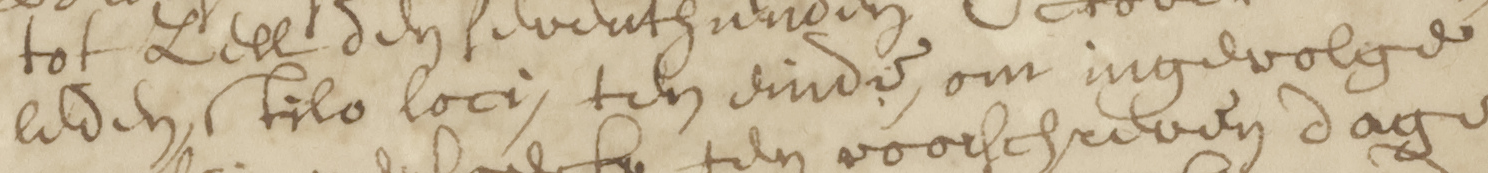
leden, stilo loci, ten einde, om ingevolge
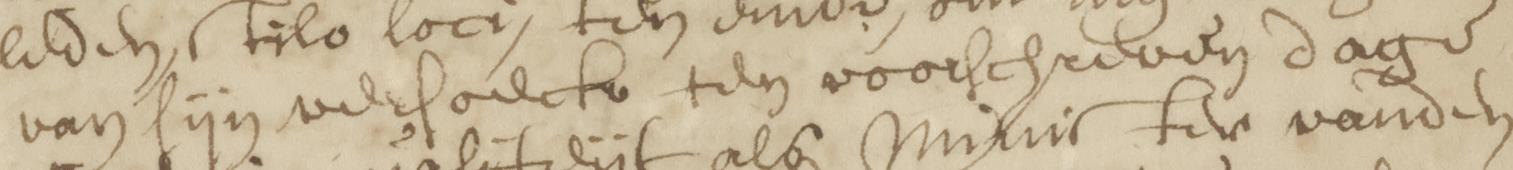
van sijn versoeck ten voorschreven dage
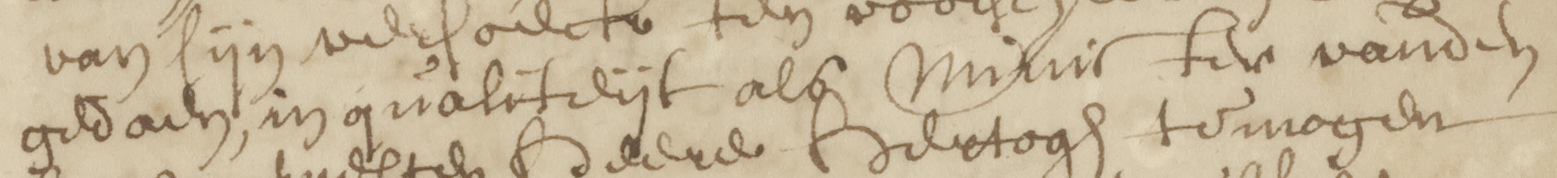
gedaen, in qualiteijt als Minister vanden
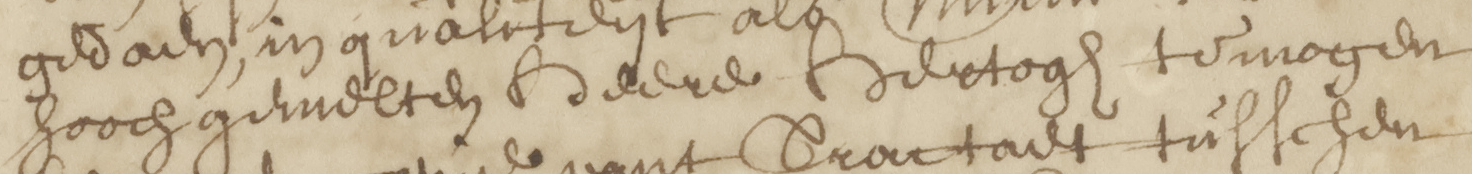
hoochgemelten Heere Hertogh te mogen
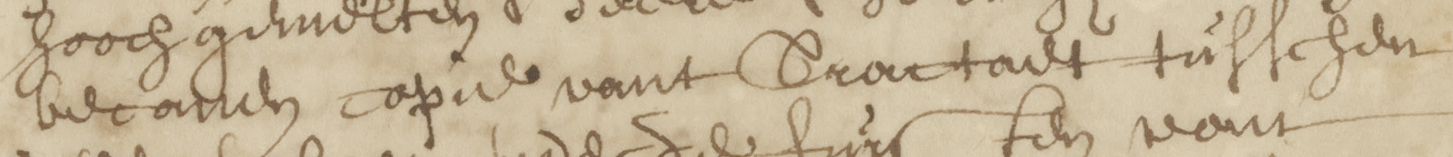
becomen copie vant Tractaet tusschen
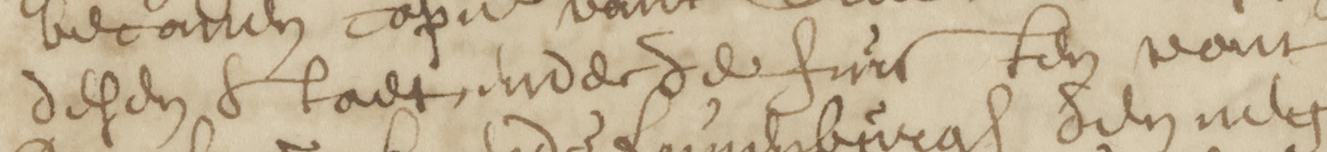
desen Staet, ende de fursten van
